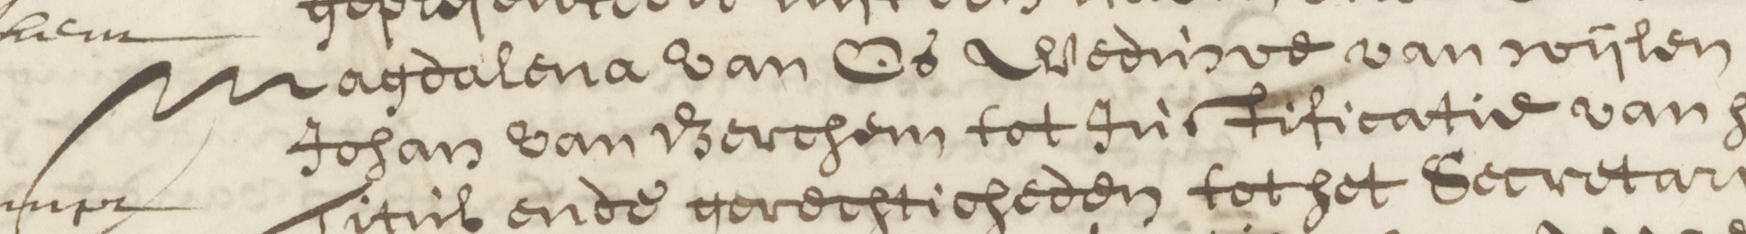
Magdalena van Os Weduwe van wijlen
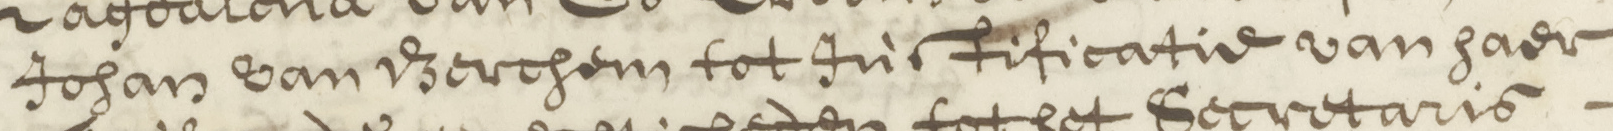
Johan van Berchem tot Justificatie van haer
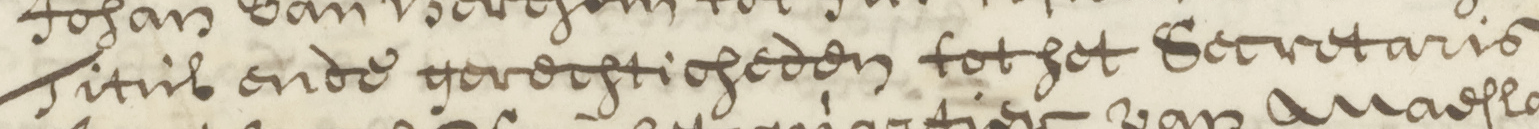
Titul ende gerechticheden tot het Secretaris
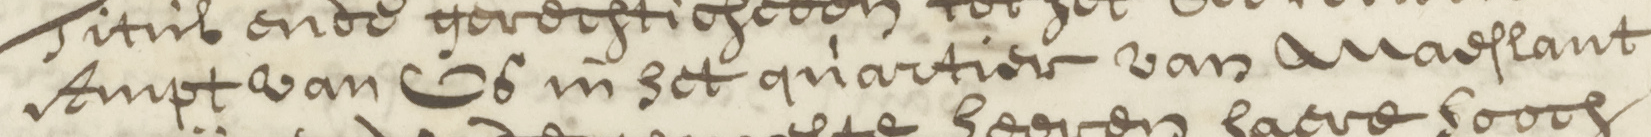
Ampt van Os in het quartier van Maeslant,
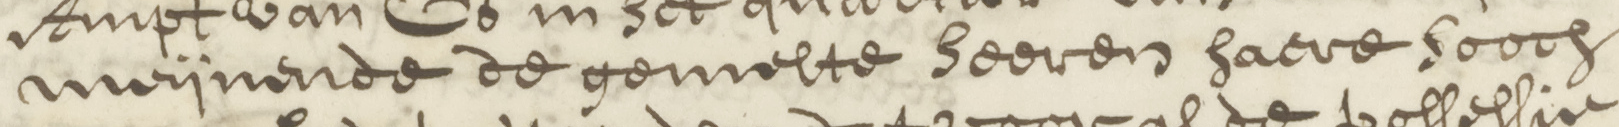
meijnende de gemelte heeren haere hooch
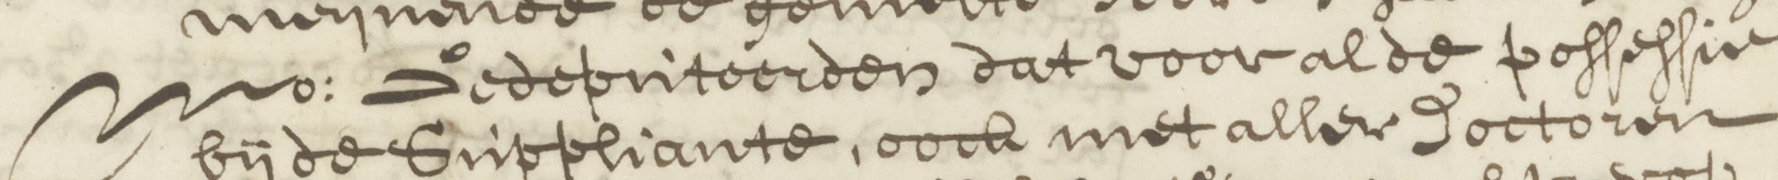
Mo: Gedeputeerden dat voor al de possessie
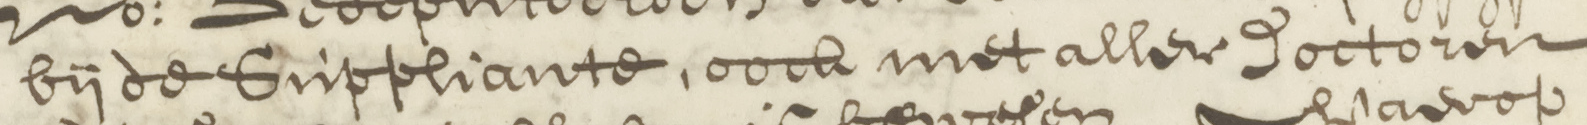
bij de Suppliante, oock met aller Doctoren
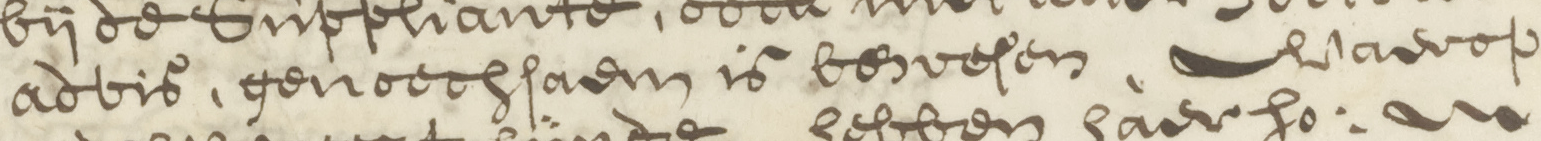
advis, genoechsaem is bewesen. Waerop
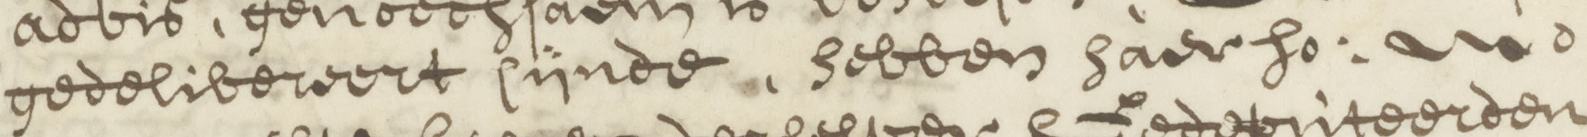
gedelibereert sijnde, hebben haer ho:Mo:
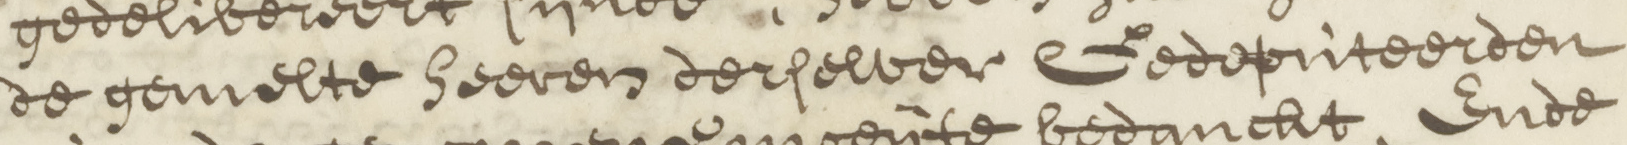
de gemelte heeren derselver Gedeputeerden
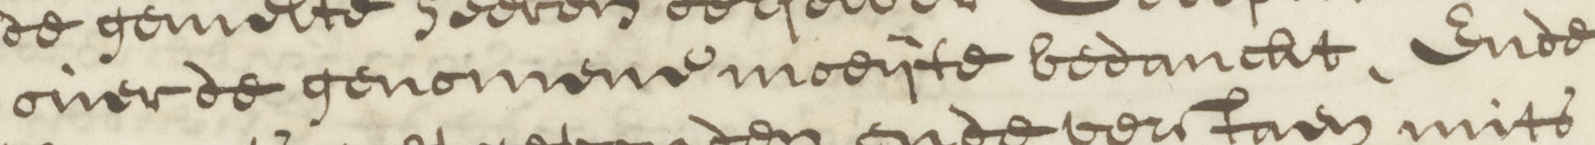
ouer de genomene moeijte bedanckt, Ende
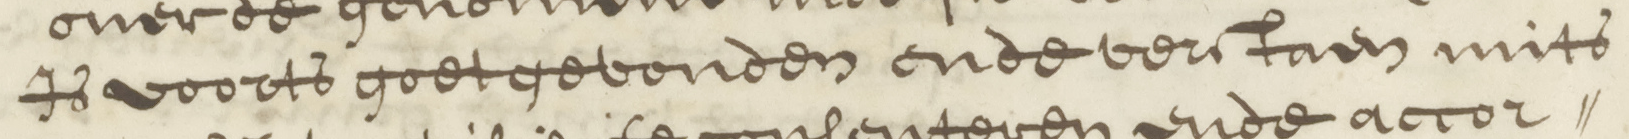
Is voorts goetgevonden ende verstaen mits
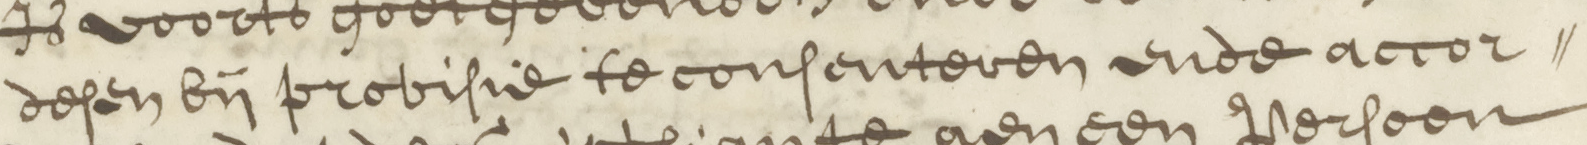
desen bij provisie te consenteren ende accor„
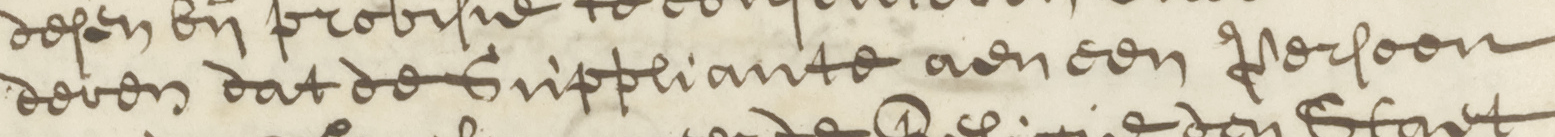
deren dat de Suppliante aen een Persoon
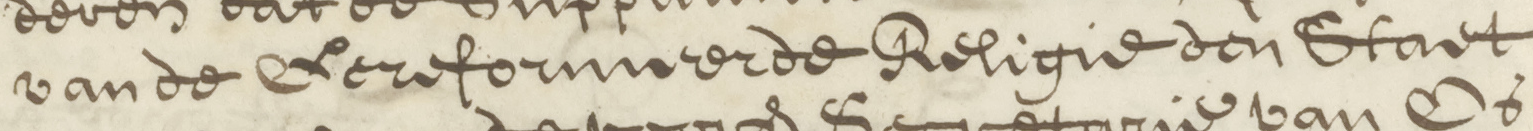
van de Gereformeerde Religie den Staet
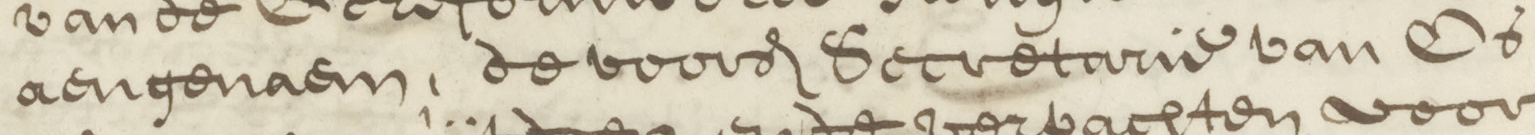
aengenaem, de voors Secretarie van Os,
